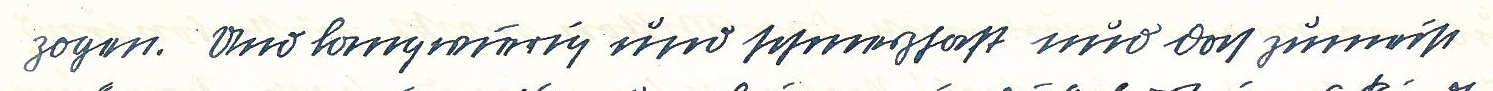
zogen. Und langwierig und schmerzhaft und doch zumeist
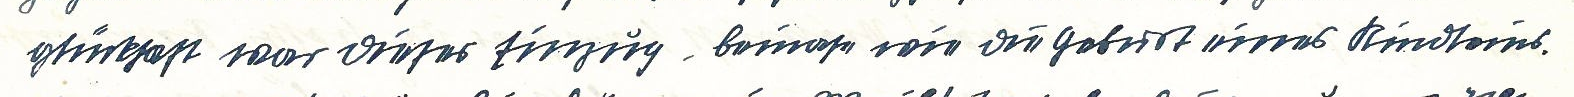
glückhaft war dieser Einzug, beinahe wie die Geburt eines Kindleins.
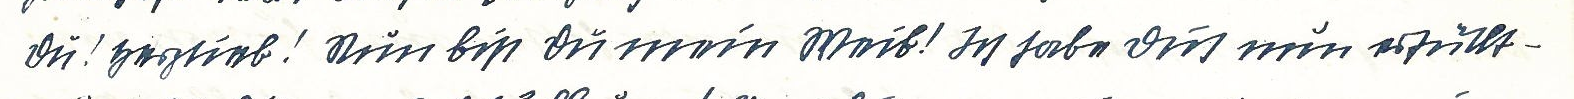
Du! Herzlieb! Nun bist Du mein Weib! Ich habe Dich nun erfüllt
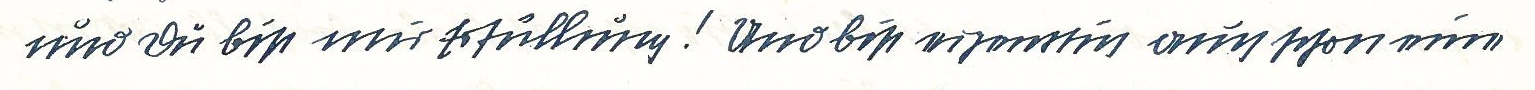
und Du bist mir Erfüllung! Und bist eigentlich auch schon eine
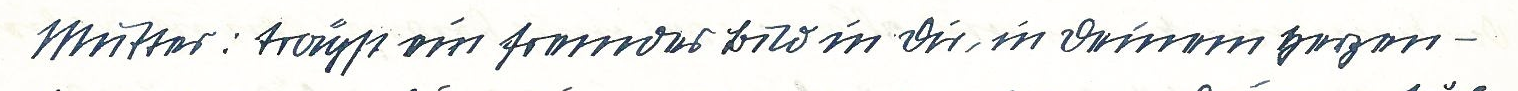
Mutter: trägst ein fremdes Bild in Dir, in Deinem Herzen –
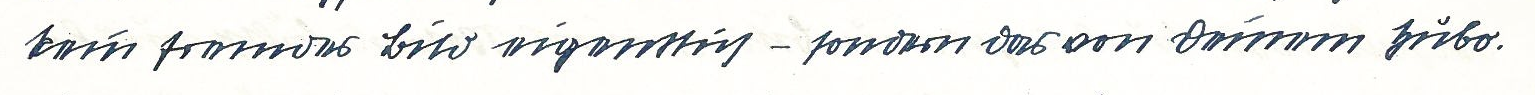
kein fremdes Bild eigentlich – sondern das von Deinem Hubo.
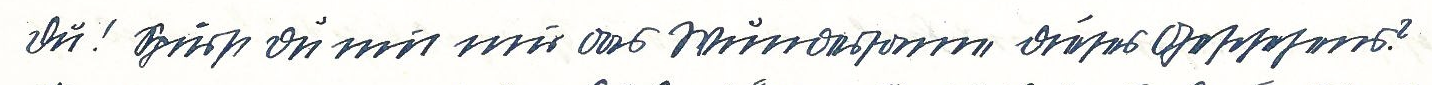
Du! Spürst Du mit mir das Wundersame dieses Geschehens?
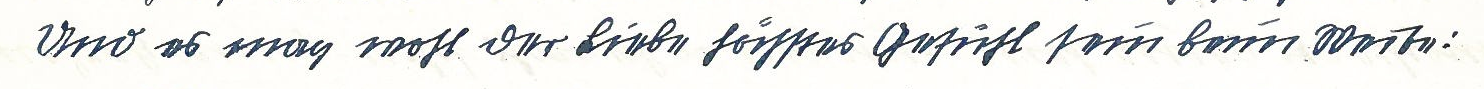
Und es mag wohl der Liebe höchstes Gefühl sein beim Weibe:
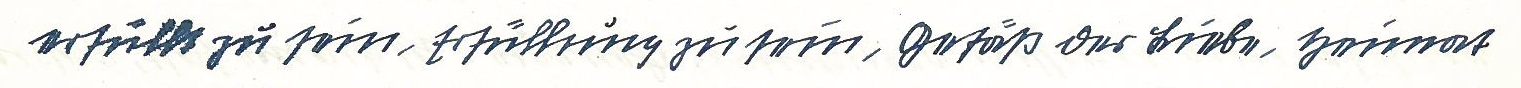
erfüllt zu sein, Erfüllung zu sein, Gefäß der Liebe, Heimat
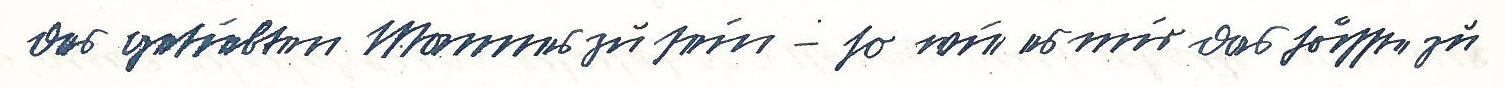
des geliebten Mannes zu sein – so wie es mir das Höchste zu
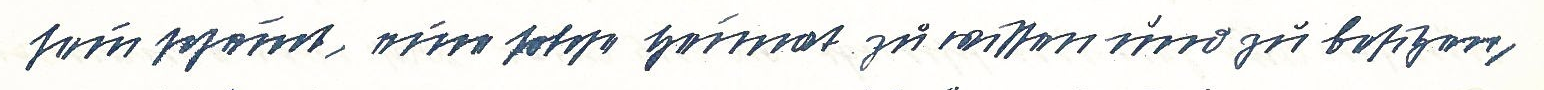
sein scheint, eine solche Heimat zu wissen und zu besitzen,
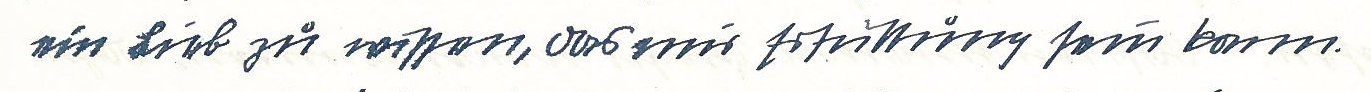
ein Lieb zu wissen, das mir Erfüllung sein kann.
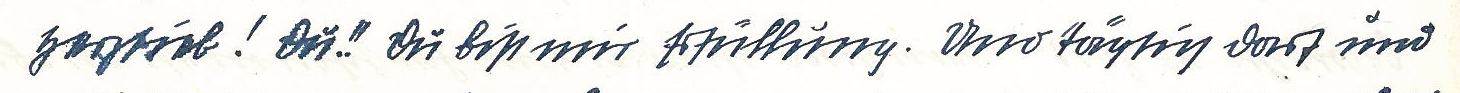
Herzlieb! Du!! Du bist mir Erfüllung. Und täglich darf und
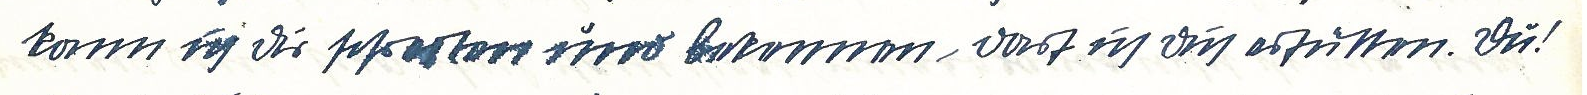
kann ich Dir schreiben und bekennen, darf ich Dich erfüllen. Du!
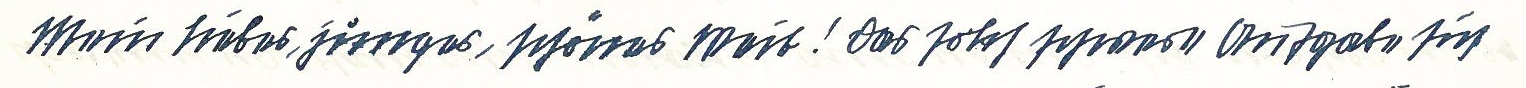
Mein liebes, schönes, junges Weib! Das solch schwere Aufgabe sich
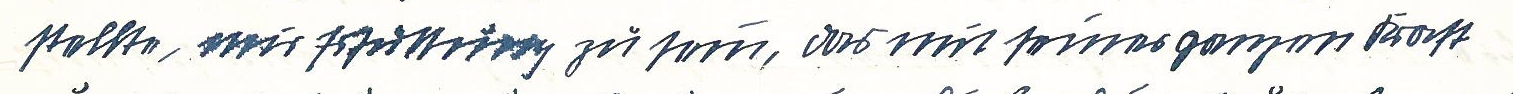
stellte, mir Erfüllung zu sein, das mit seiner ganzen Kraft
